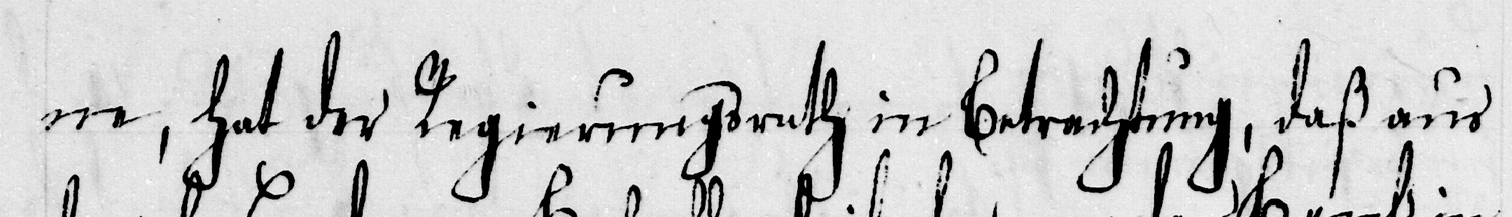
ne, hat der Regierungsrath in Betrachtung, daß aus
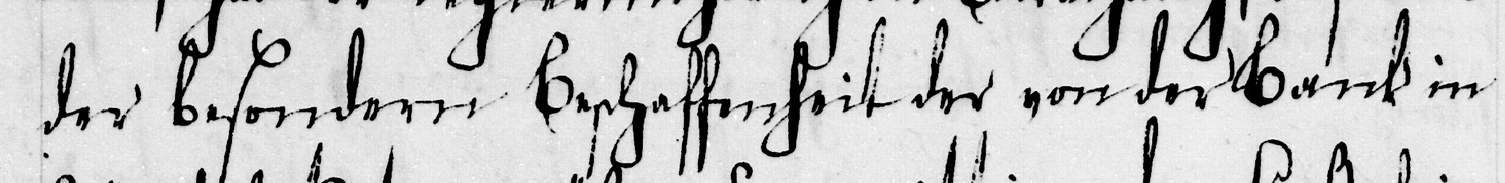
der besondern Beschaffenheit der von der Bank in
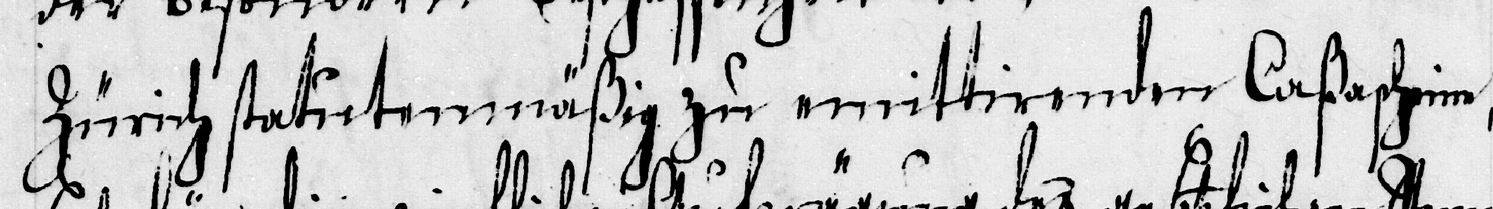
Zürich statutenmäßig zu emittirenden Caßaschei¬
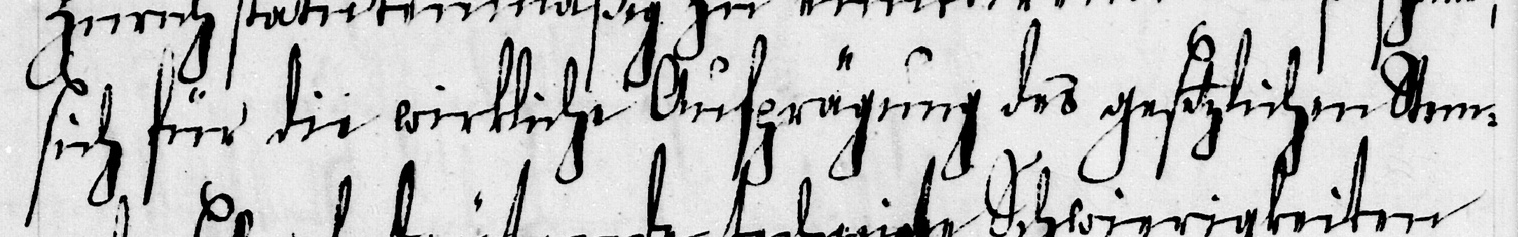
sich für die wirkliche Aufprägung des gesetzlichen Stem¬
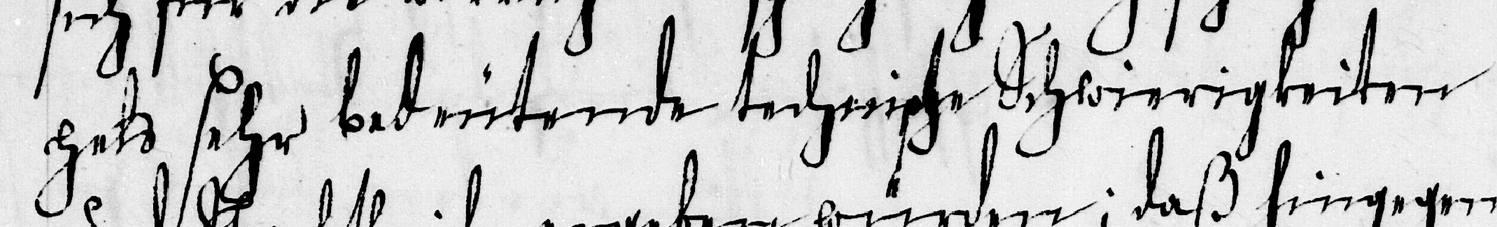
tzes sehr bedeutende technische Schwierigkeiten
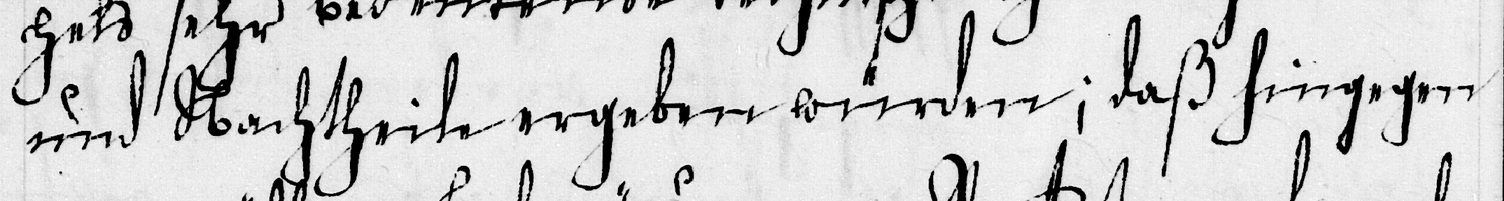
und Nachtheile ergeben würden; daß hingegen
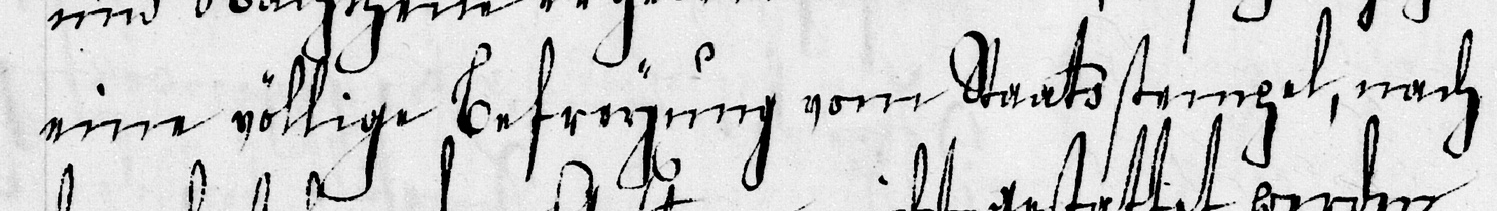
eine völlige Befreyung vom Staatsstempel, nach
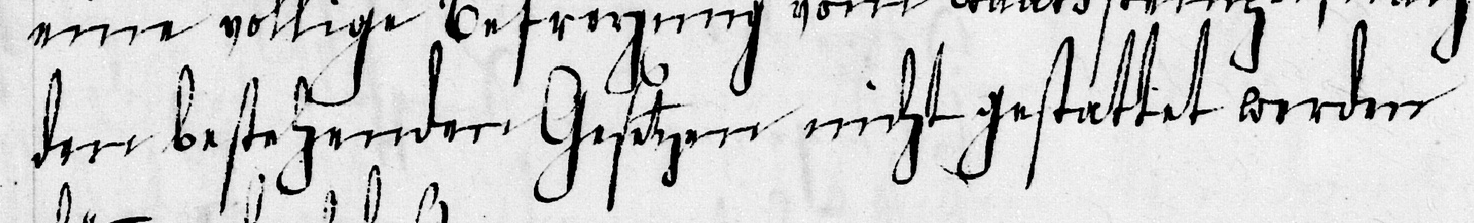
den bestehenden Gesetzen nicht gestattet werden
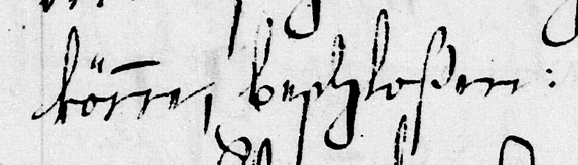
könne, beschloßen:
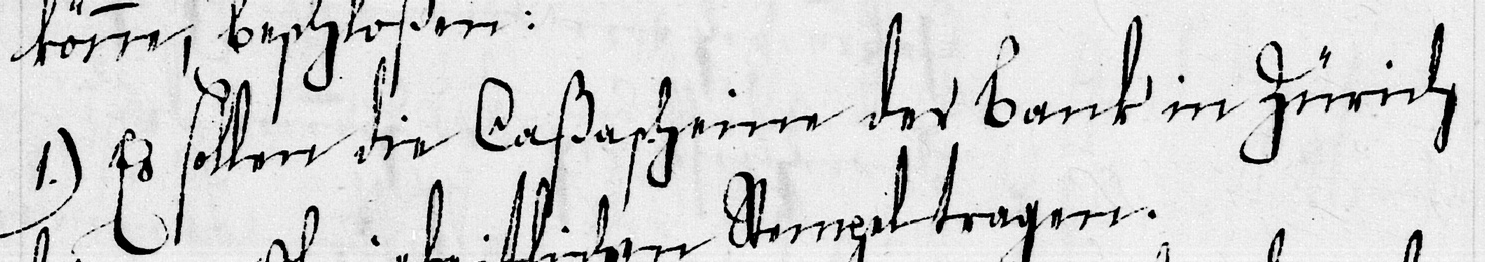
Es sollen die Caßascheine der Bank in Zürich
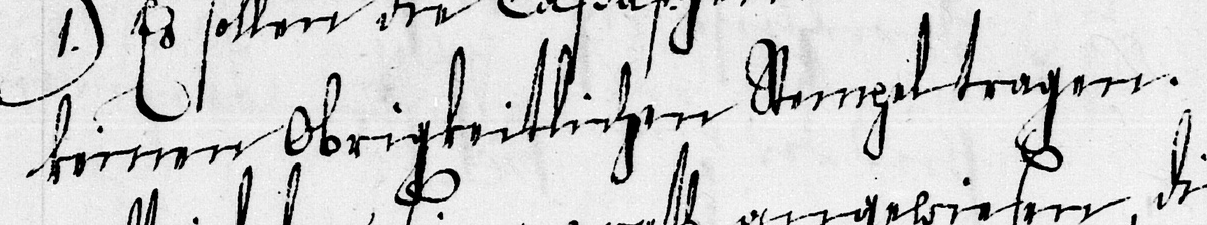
keinen obrigkeitlichen Stempel tragen.
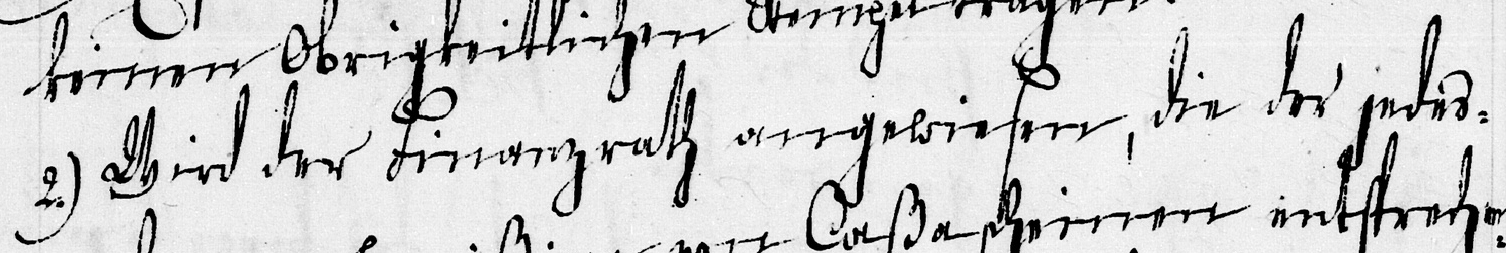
2.) Wird der Finanzrath angewiesen, die der jedes¬
